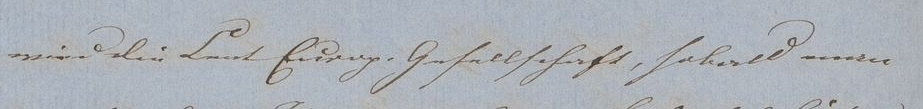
wird die Cent Europ. Gesellschaft, sobald man
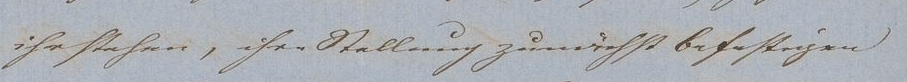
ihr stehen, ihre Stellung zunächst befestigen
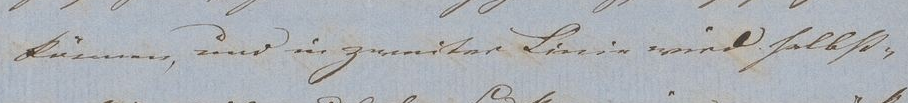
können, und in zweiter Linie wird selbst-
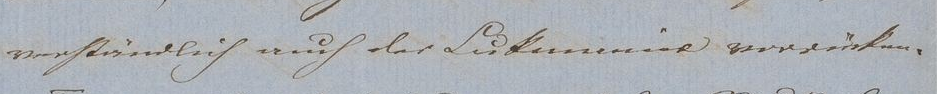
verständlich auch der Lukmanier vorrücken.
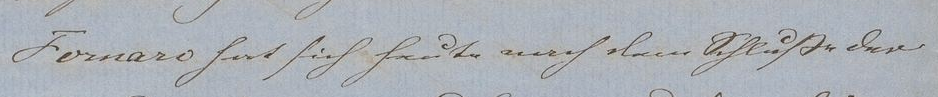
Fornaro hat sich heute nach dem Schluße der
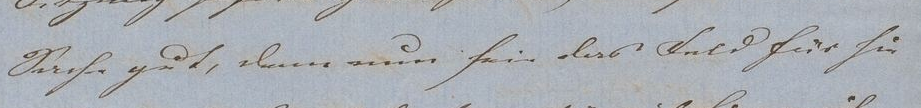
Sache gut, denn nun seie das Feld für sie
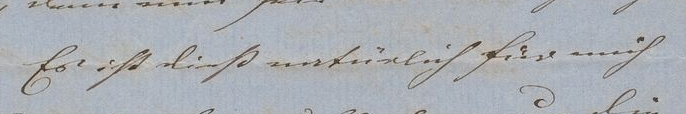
Es ist dieß natürlich für mich
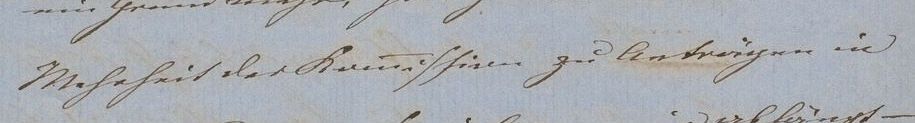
Mehrheit der Kommission zu Anträgen in
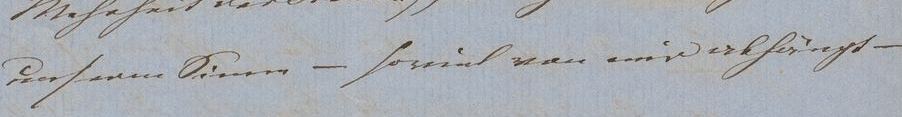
unserm Sinne – soviel von mir abhängt –
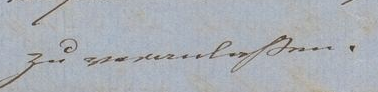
zu veranlaßen.
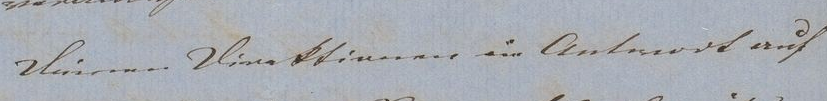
Deinen Direktionen in Antwort auf
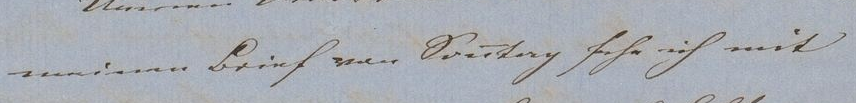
meinen Brief von Sonntag sehe ich mit
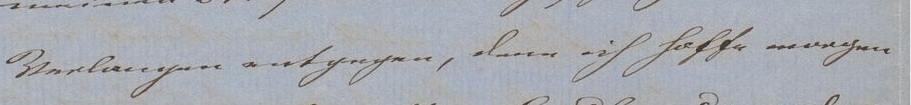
Verlangen entgegen, denn ich hoffe morgen
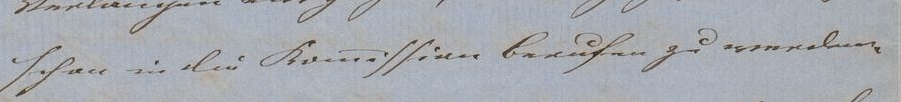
schon in die Kommission berufen zu werden.
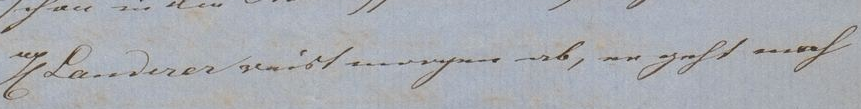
H Landerer reist morgen ab, er geht nach
